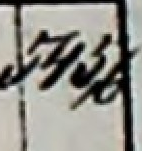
545,0
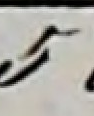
5
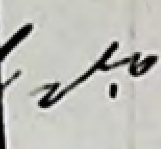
Do
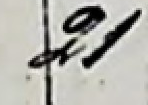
21
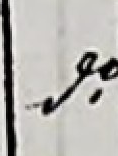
Do
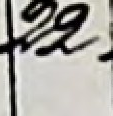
22
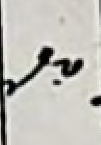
Do
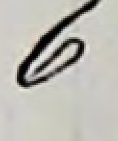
6
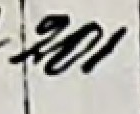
201
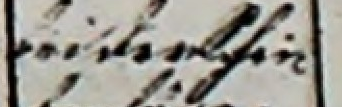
Bei der Schin???
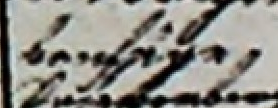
???
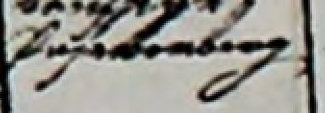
P???berg
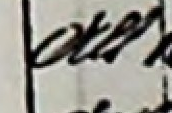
Alt
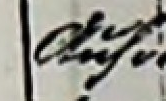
Aus„
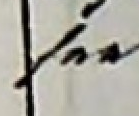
see
